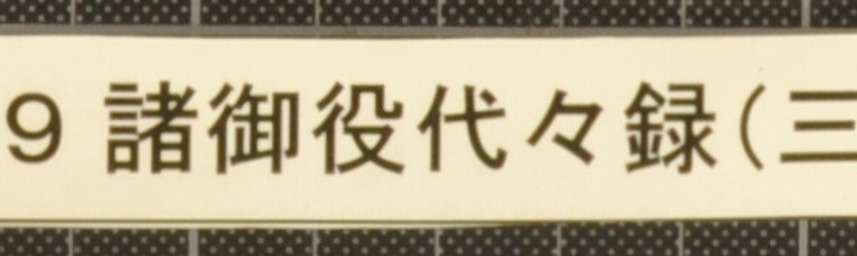諸御役代々録三
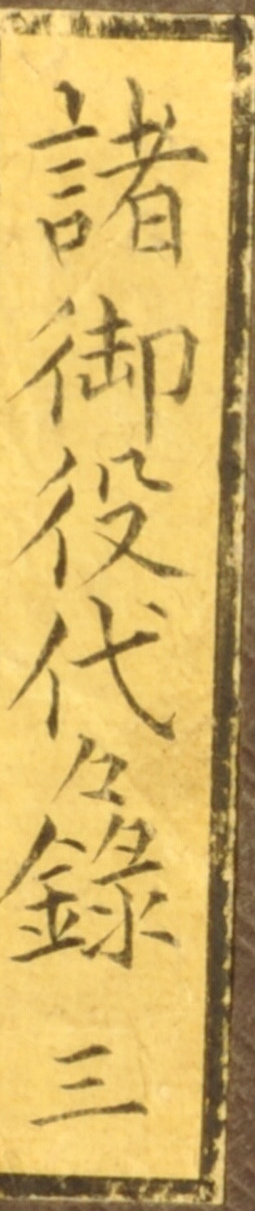諸御役代々録三

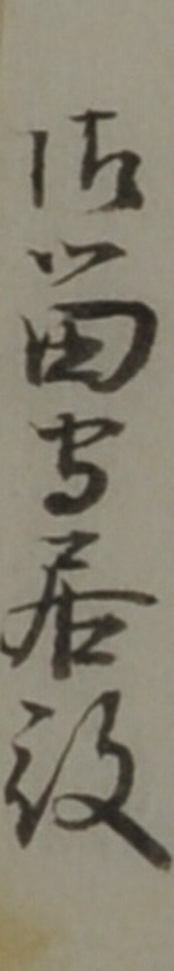御留守居役
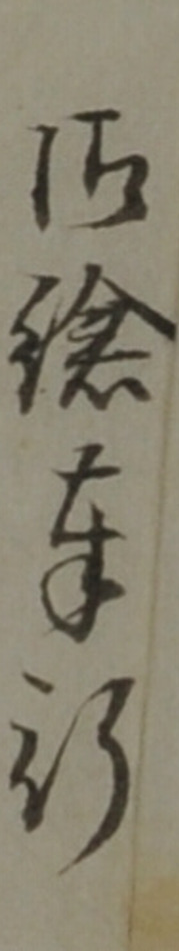御鎗奉行
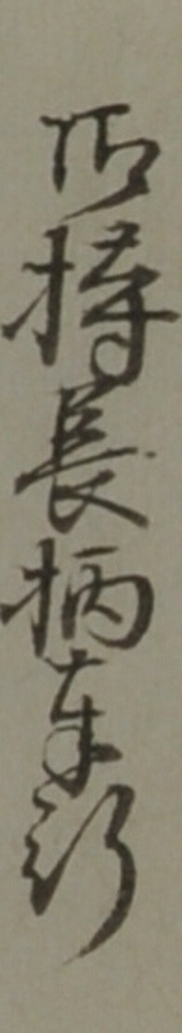御持長柄奉行
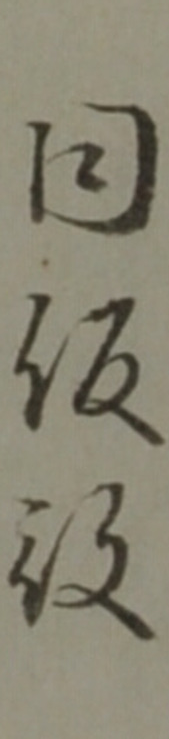同仮役
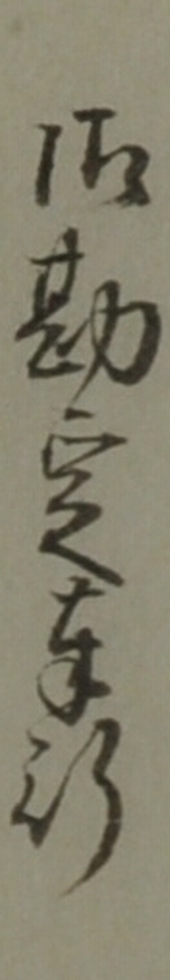御勘定奉行
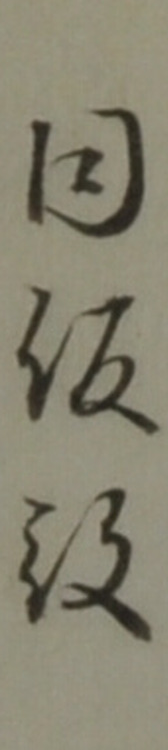同仮役
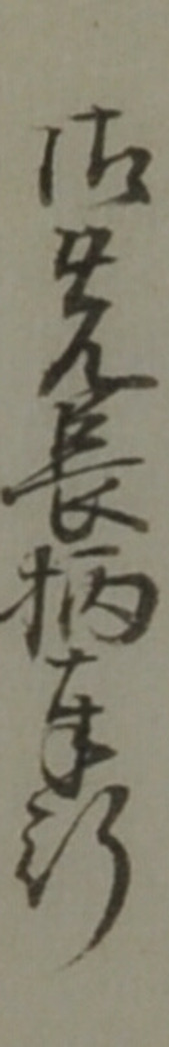御先長柄奉行
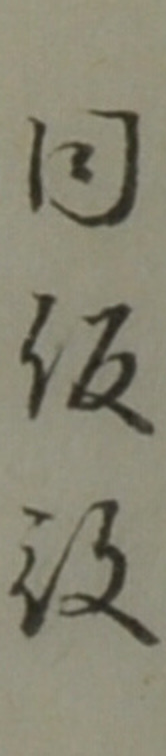同仮役
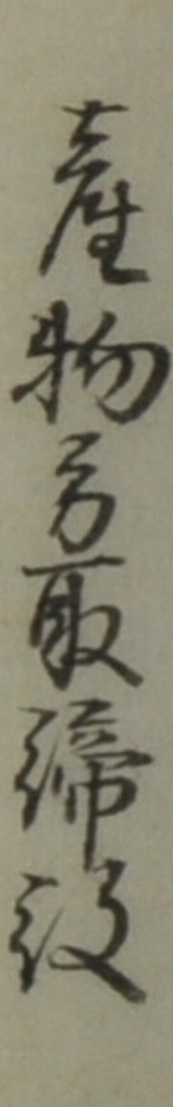産物方取締役
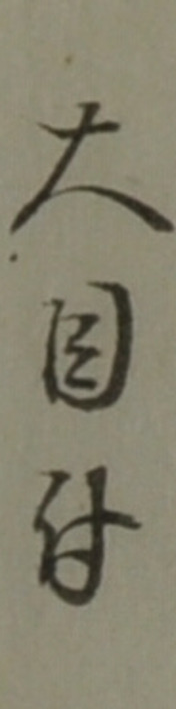大目付
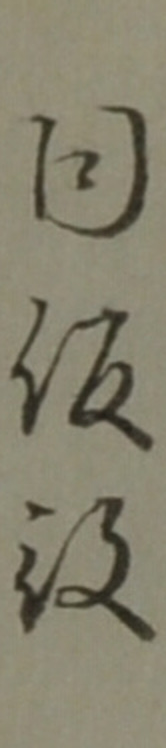同仮役

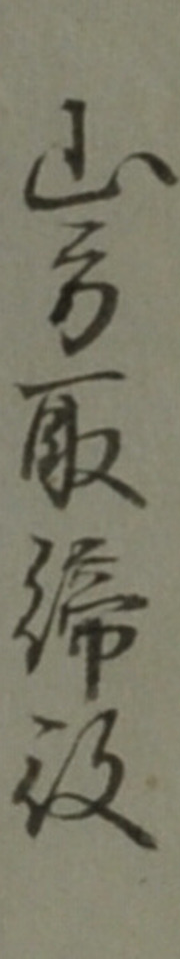山方取締役
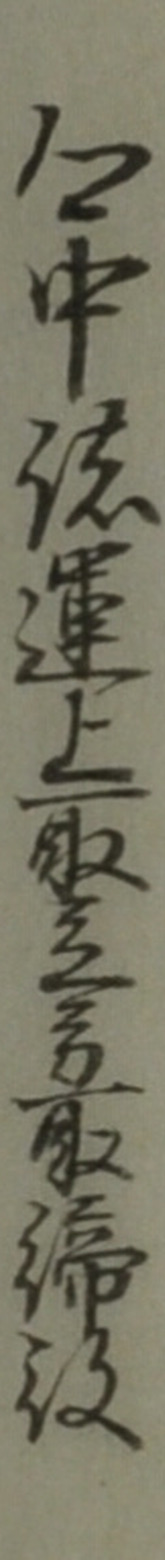郷中諸運上取立方取締役
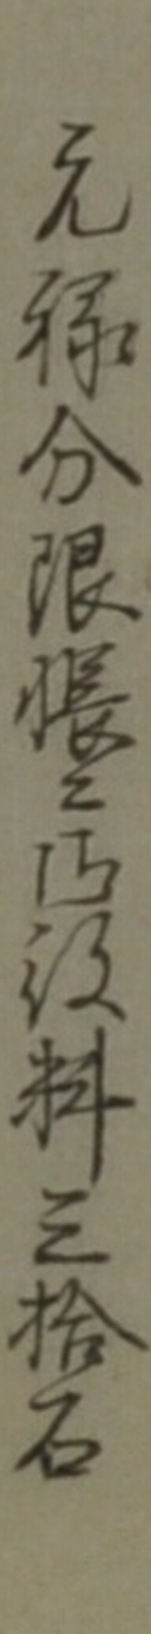元禄分限帳ニ御役料三拾石
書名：諸御役代々録（三）
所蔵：伊那市立高遠町図書館・合同会社AMANE
